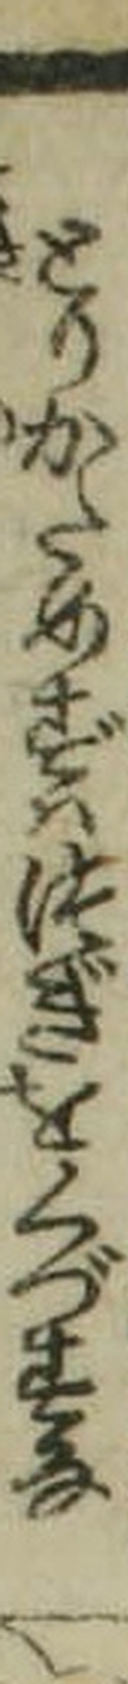とりかためずはつぎをくづすな
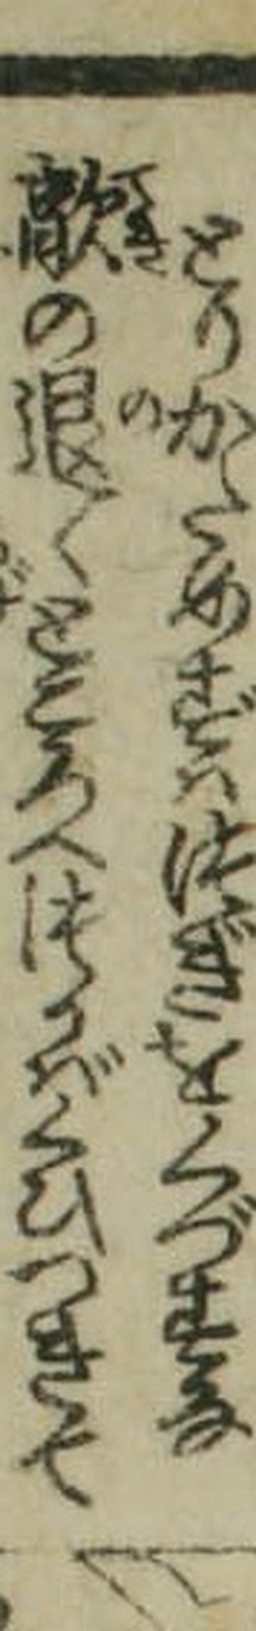敵の退くところへつかばくひつきて
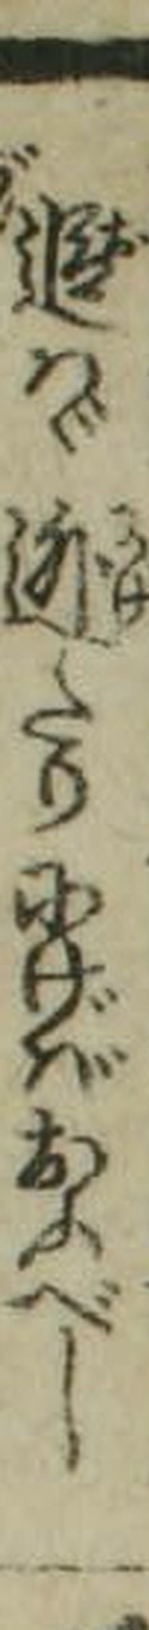追はゞ逃たりにげばおふべし
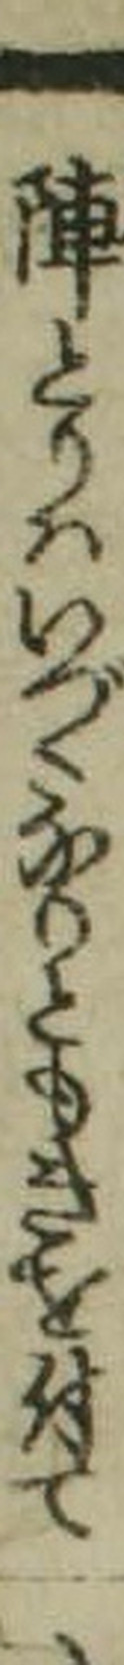陣とりはいづくなりともきを付て
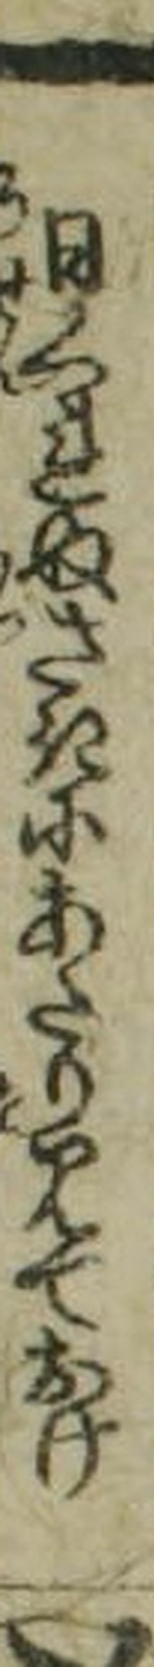日くれぬさきにあたり見ておけ
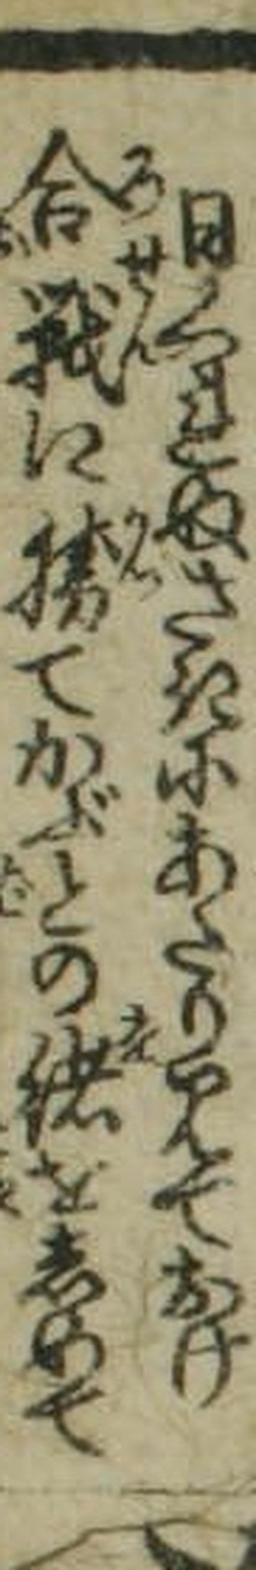合戦に勝てかぶとの緒をしめて
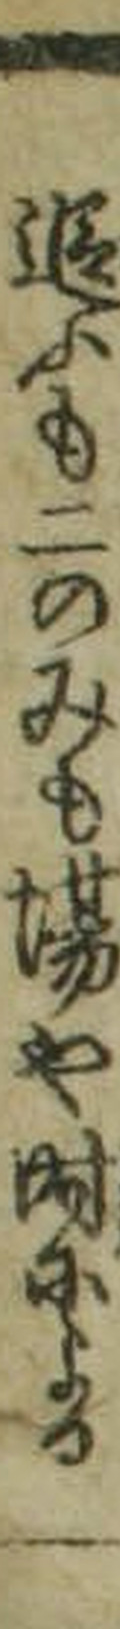追ふも二のみも場や時による
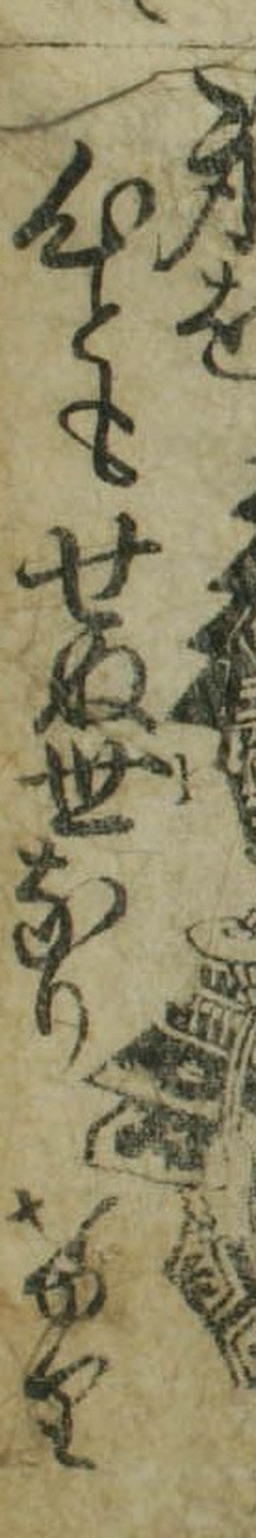心ともせぬ世なりけり

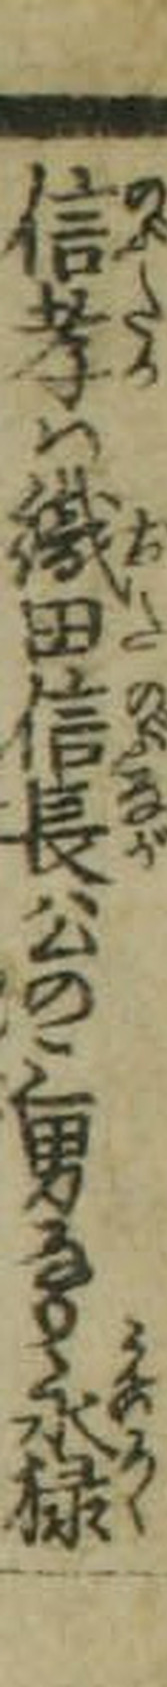信孝は織田信長公の三男なり永禄
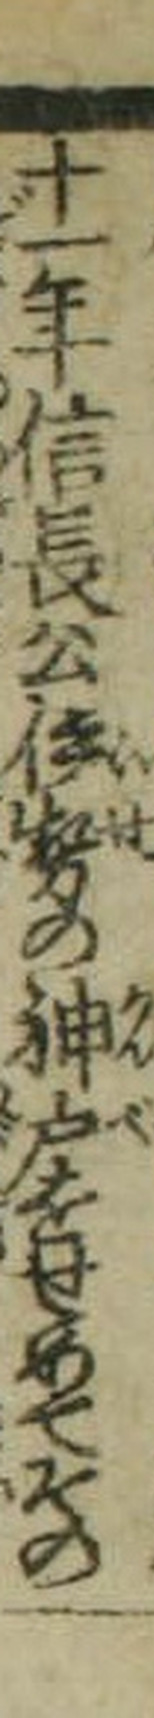十一年信長公伊勢の神戸をせめてその
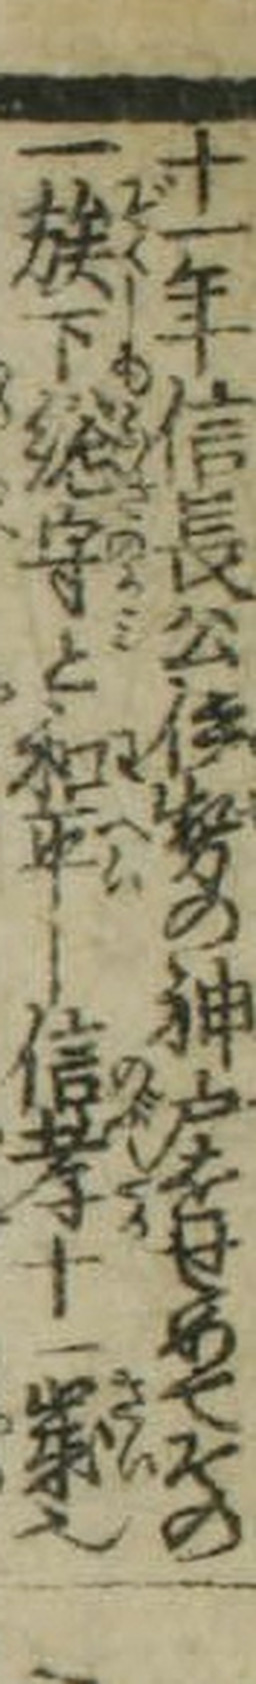一族下総守と和平し信孝十一歳也
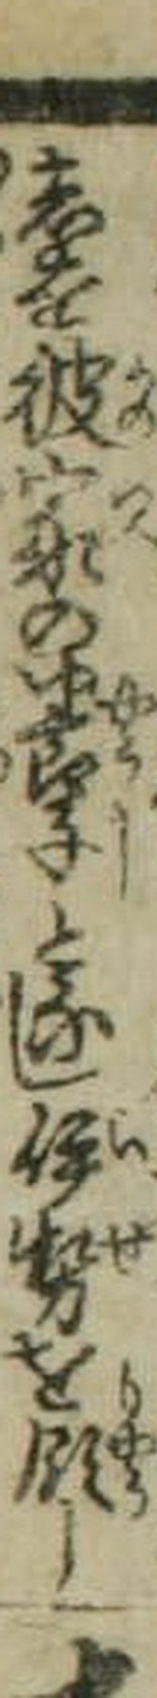しを彼家の養子となし伊勢を領し
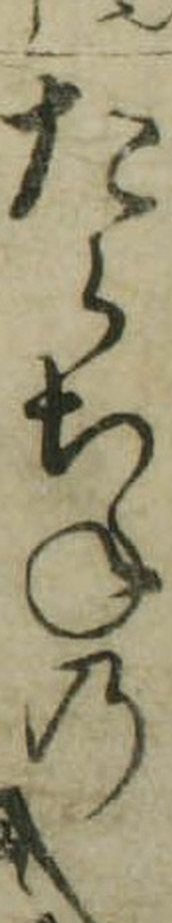たらちねの
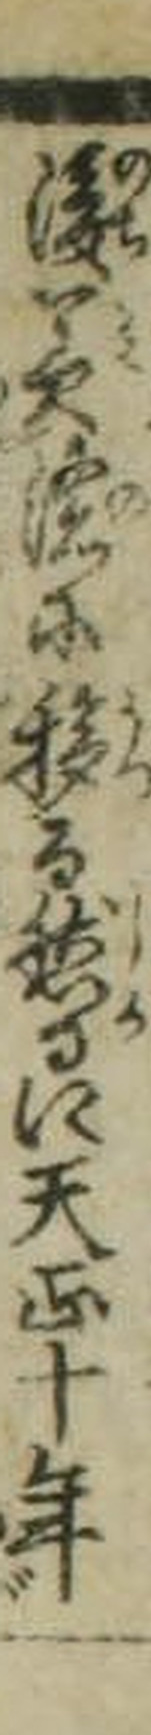後美濃に移る然るに天正十年
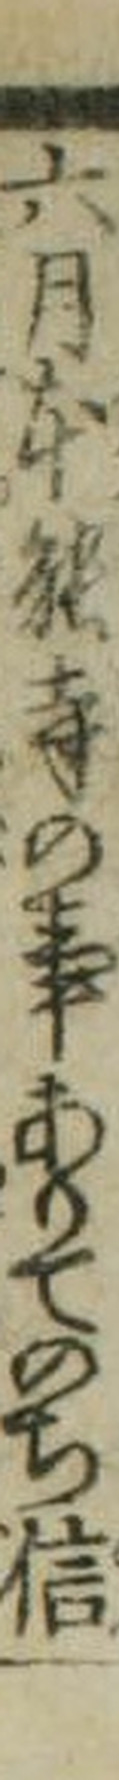六月本能寺の事ありてのち信
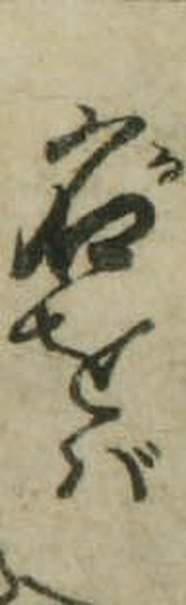名をば
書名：續英雄百人一首
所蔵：東京学芸大学附属図書館
